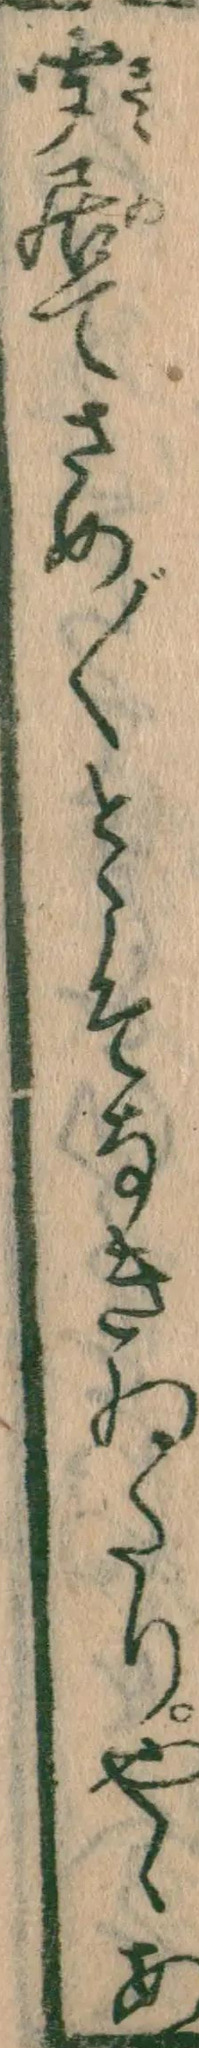聞居てさめ〴〵とこそなきゐたり。やゝあ
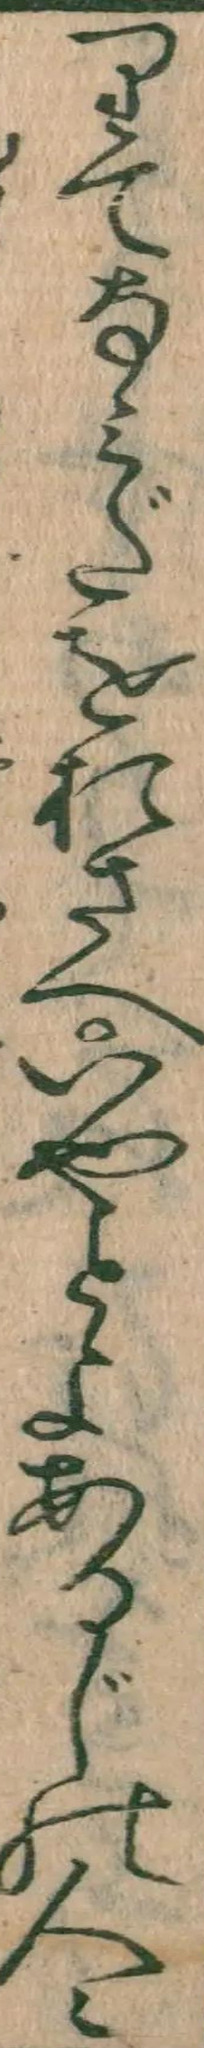りてなみだをおさへ。いやとよあるじの人々
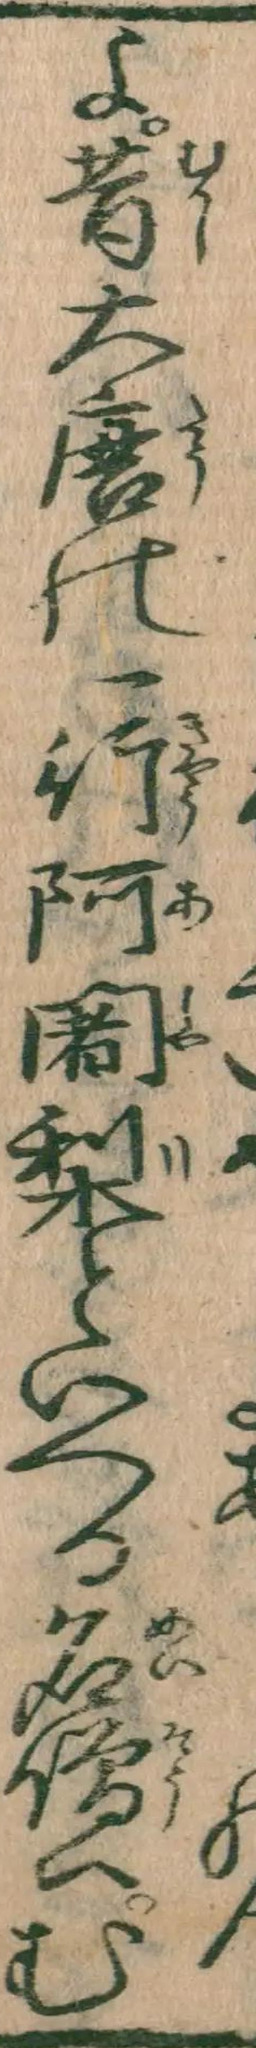よ。昔大唐の一行阿闍梨といへる名僧は。む
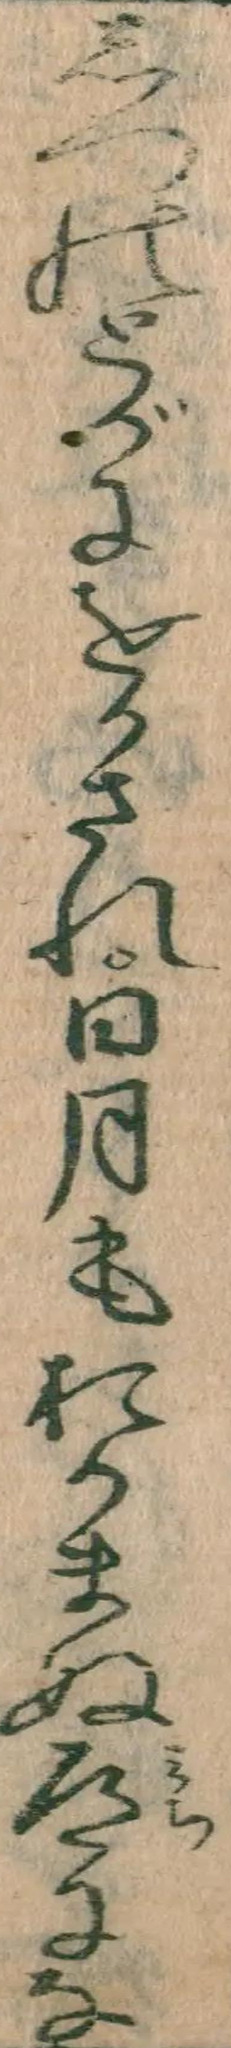しつのとがにをかされ。日月もおかまぬ道にな
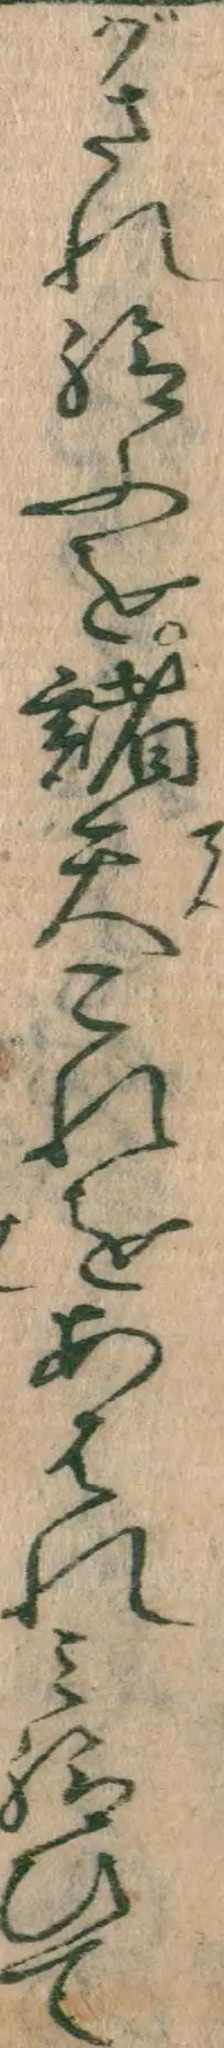がされ給ふを。諸天これをあはれみ給ひて
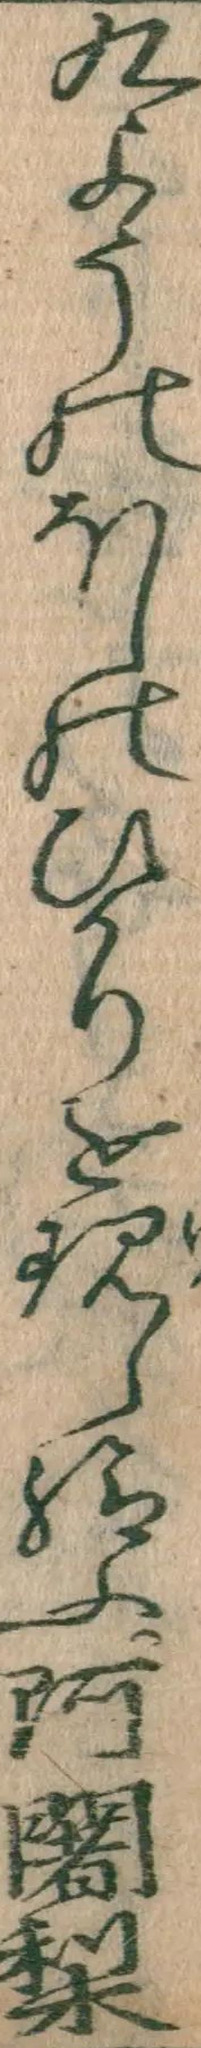九ようのほしのひかりを現し給ふ。阿闍梨
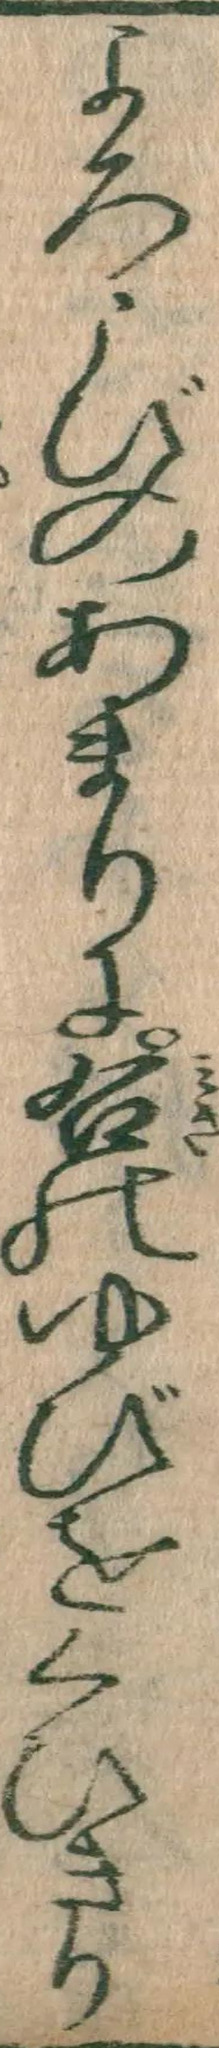よろこびのあまりに右のゆびをくひきり
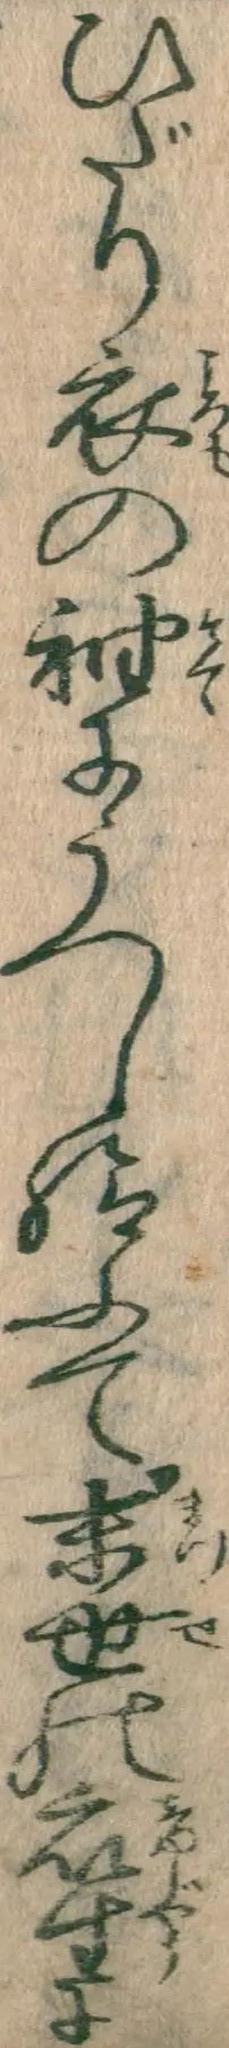ひだり衣の袖にうつし給ふて、末世の衆生に
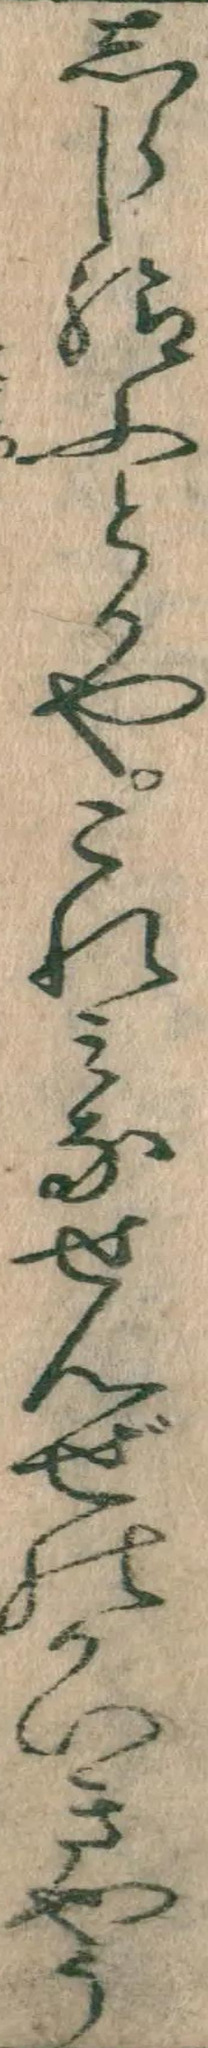しらし給ふとかや。これみなせんぜのかいきやう
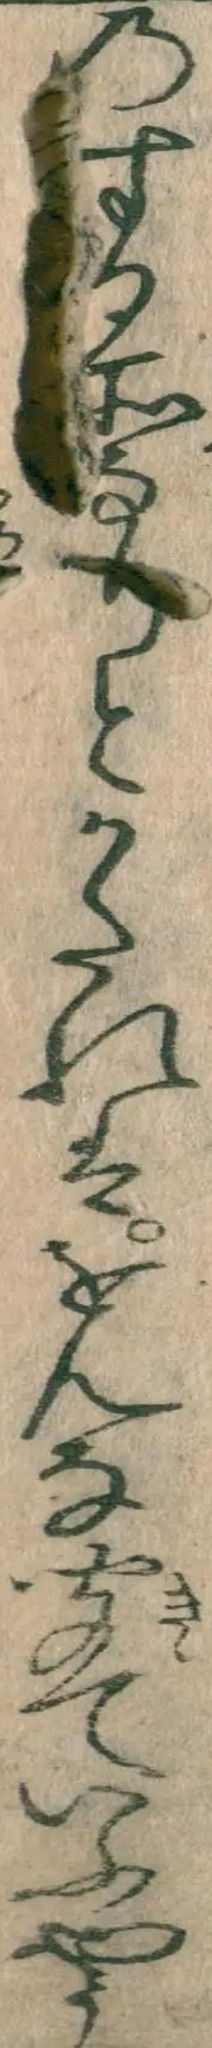のする所なりとかたれは。をんな聞ていふやう
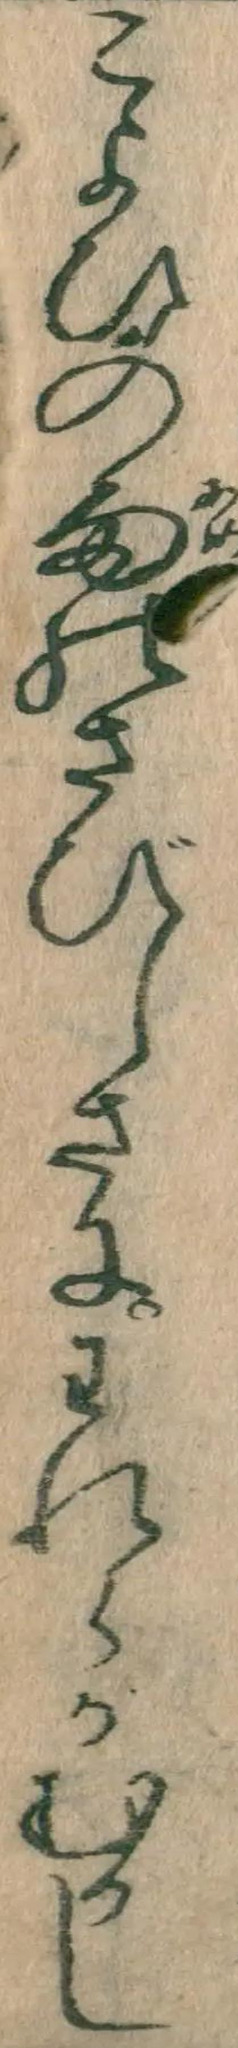こよひの雨のさびしさに。われらかむかし

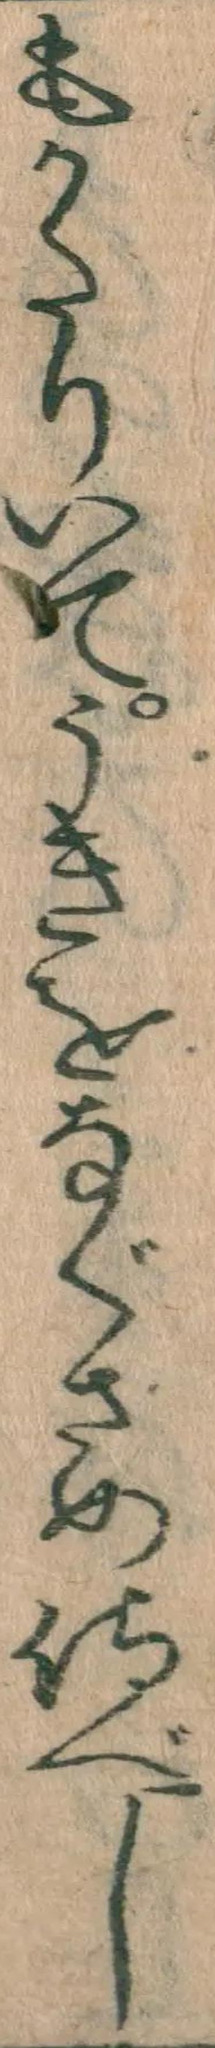もかたりいて。うきをなぐさめ侍べし
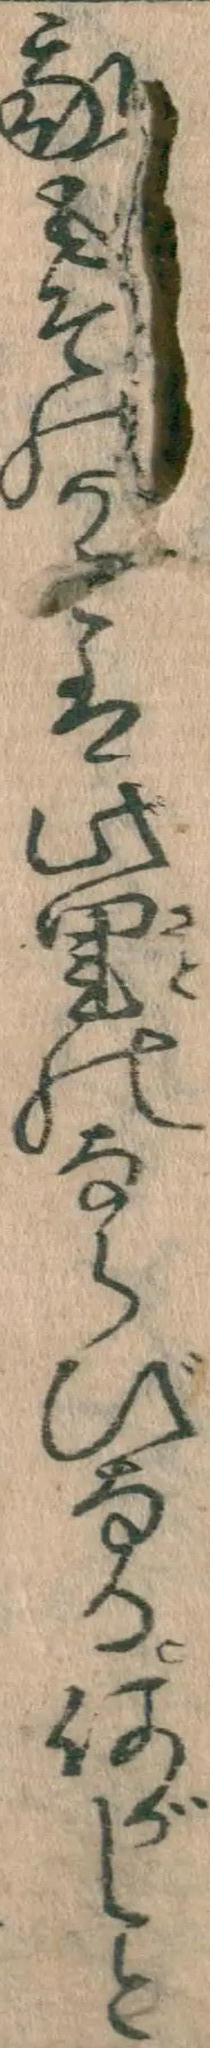我もそのかは此里のならびなる。何がしと
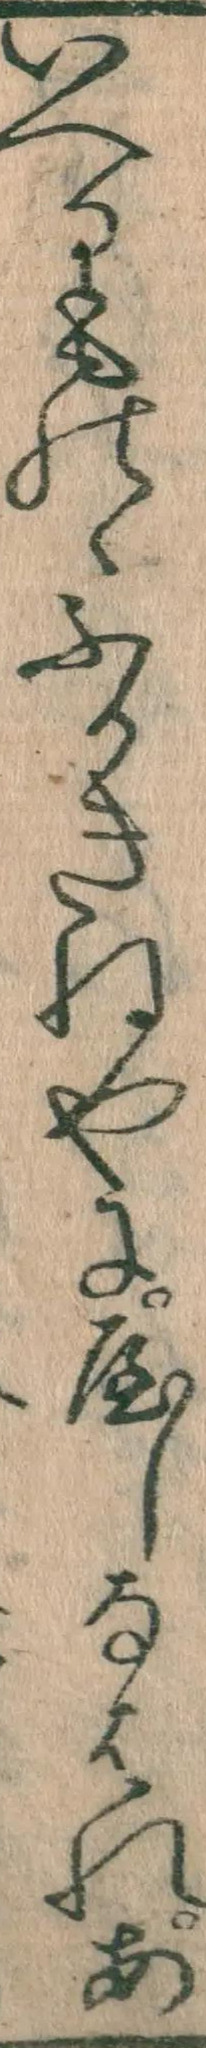いへるにものゝふかきねやに。やしなはれ。あ
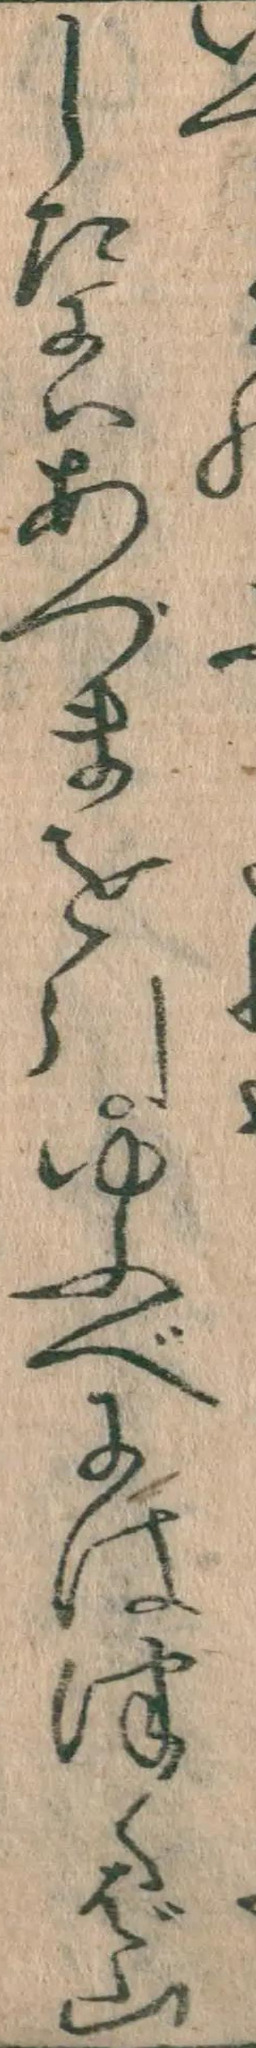したにはあづまを引。ゆふべにはつくば山
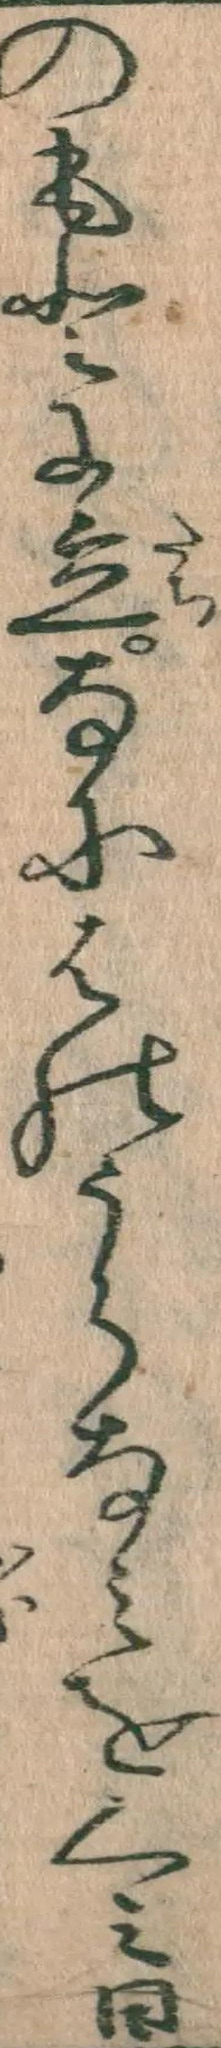のもとに立。なにはのうらなみをくみ日
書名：竹斎狂歌物語 3巻
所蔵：国立国会図書館 National Diet Library, JAPAN
